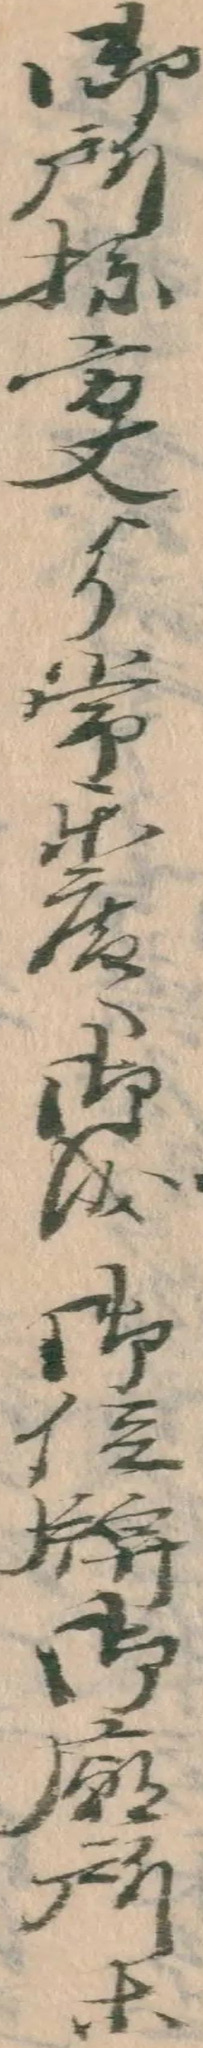御所様方丈より常楽庵へ御成御位牌御廟所等
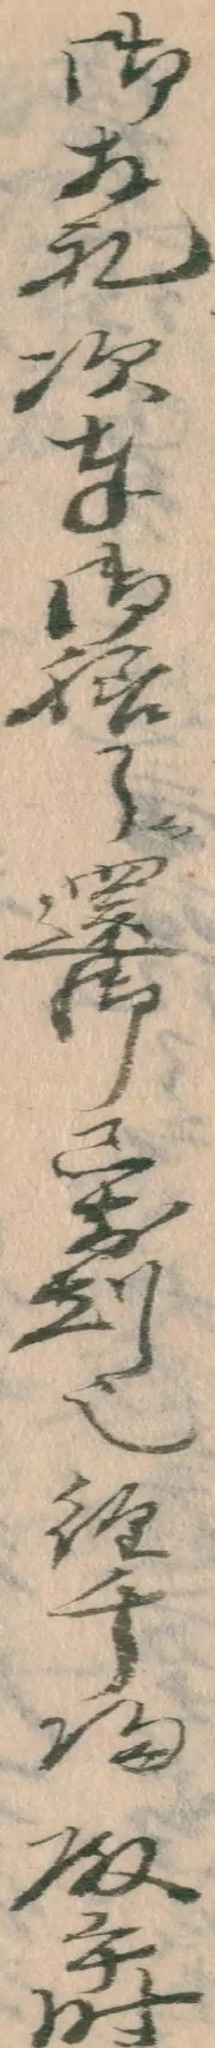御相礼次奉御膳了還御巳前刻也経千帰殿午時
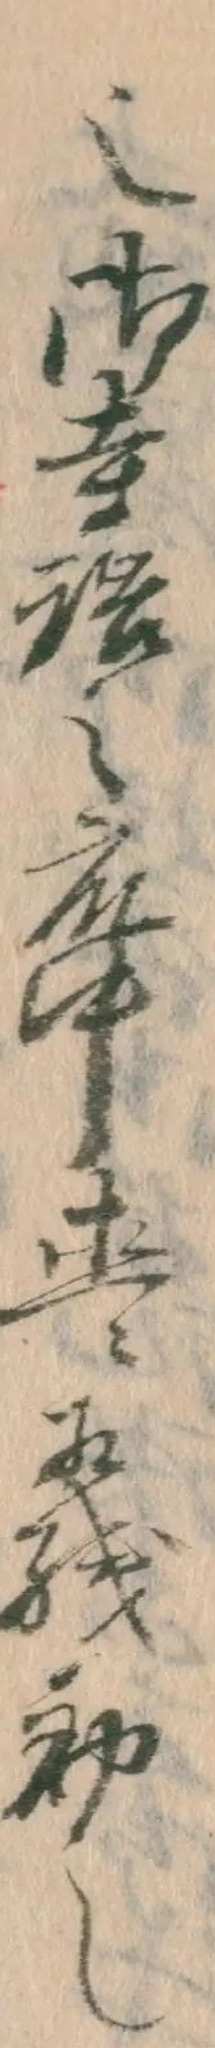也御寺詰之衆中直ニ相残勤之
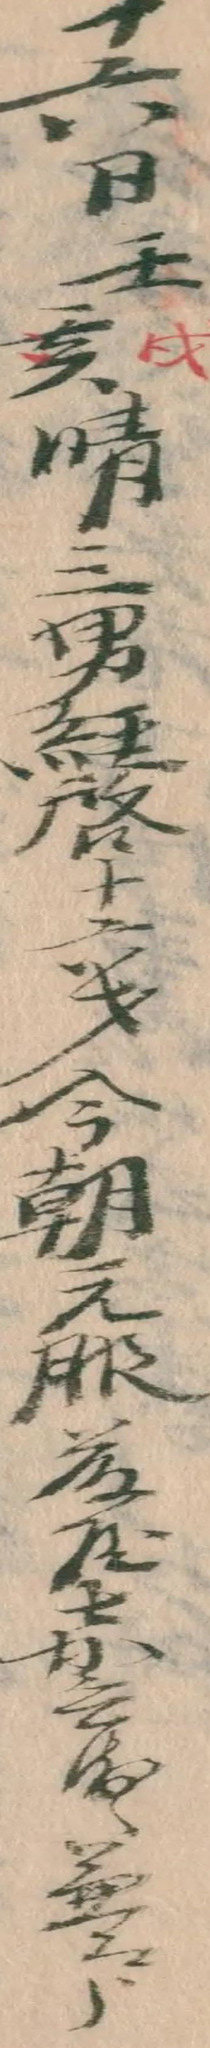十六日壬亥晴三男経啓十六才今朝元服藤屋嘉兵衛へ兼而申
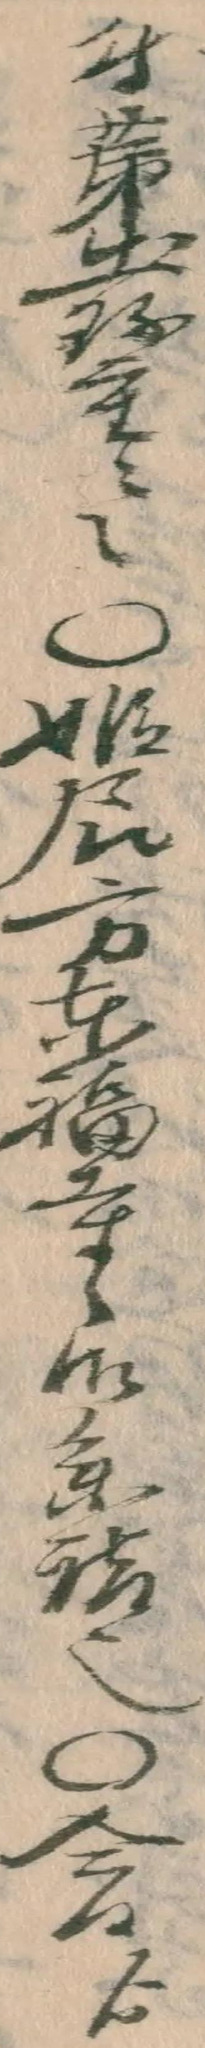付芽出珍重云々〇姫君方東福寺へ御参詣也○今日ゟ
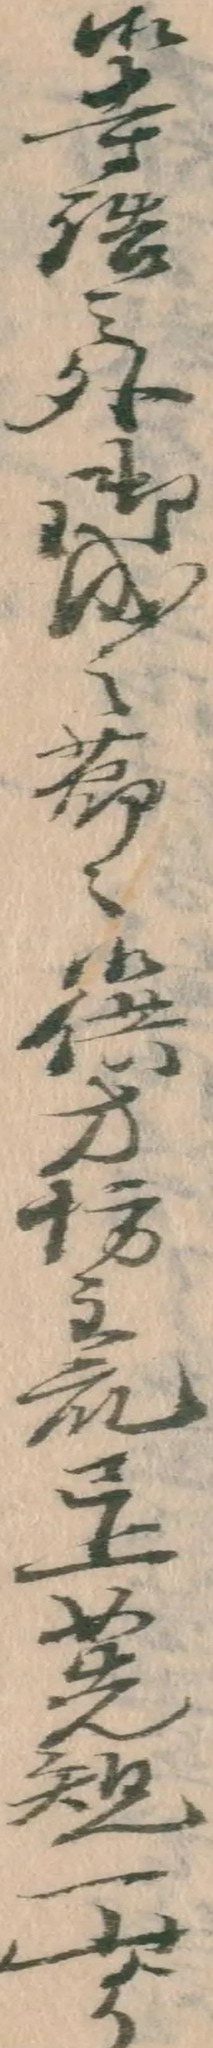御寺詰之外御成之節之御供方坊主衆已上如先規一山ゟ
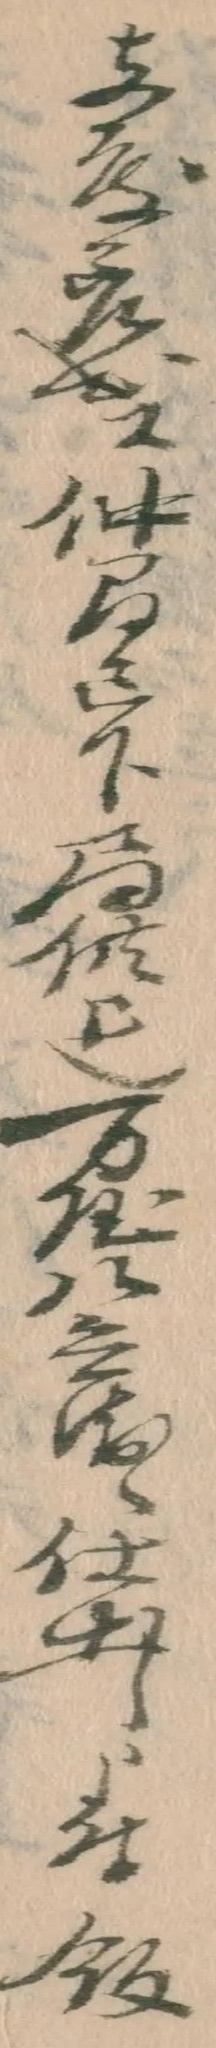支度差出候仲間已下局供迄万屋八兵衛へ仕出し申付飯
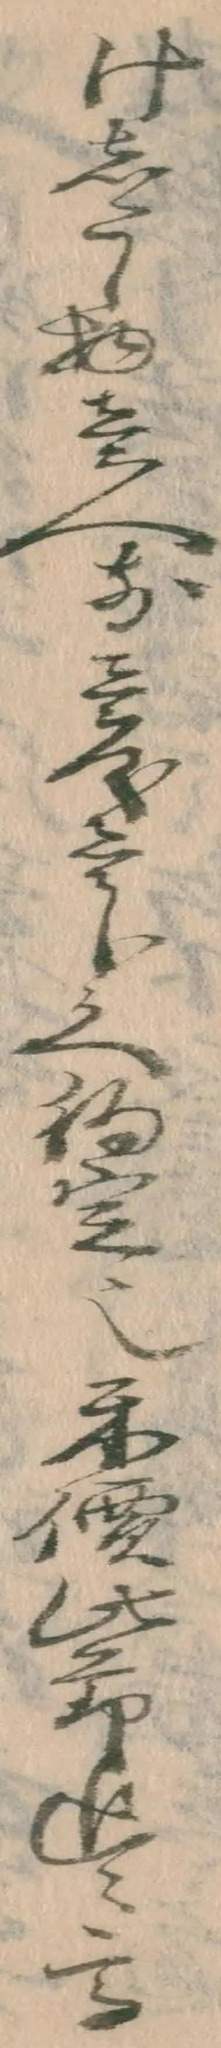汁したし物壱人前壱匁壱分かへ約定也米価此節追々高
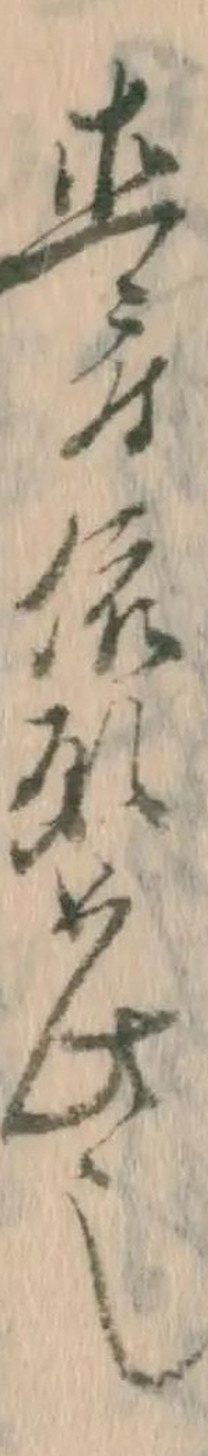直ニ付依願如此也
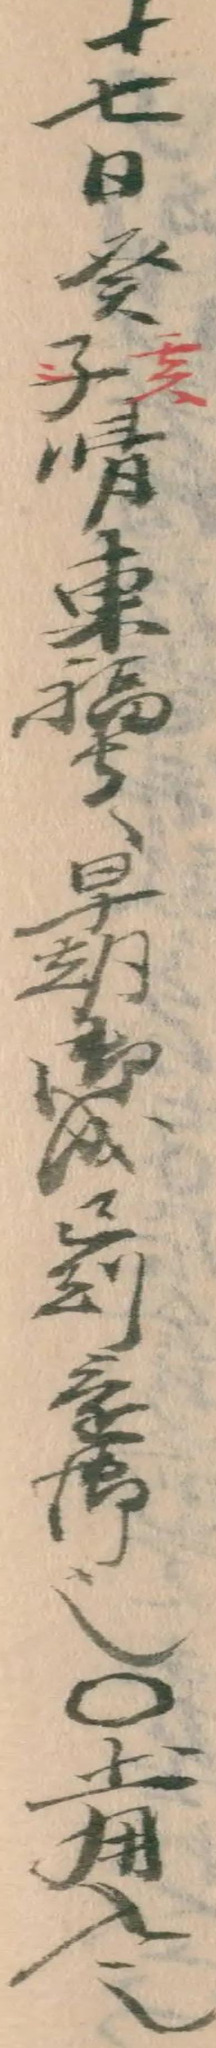十七日癸子晴東福寺へ御早朝御成巳刻還御也○土用入也
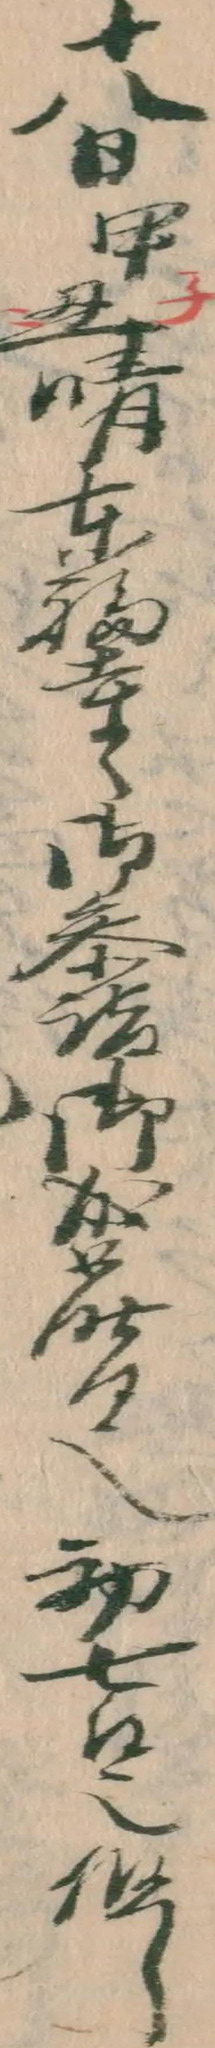十八日甲丑晴東福寺へ御参詣御成如昨日也初七日也但し
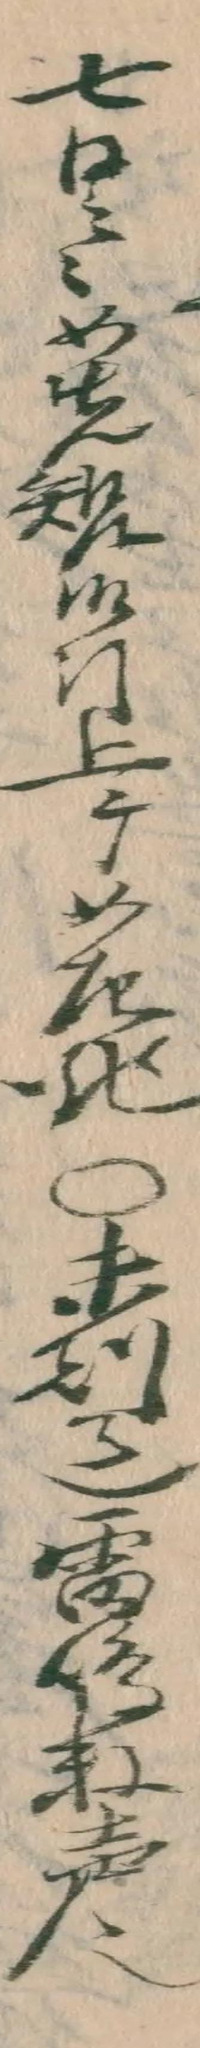七日々々如先規御引上ケ如左記○未刻過雷鳴数声也
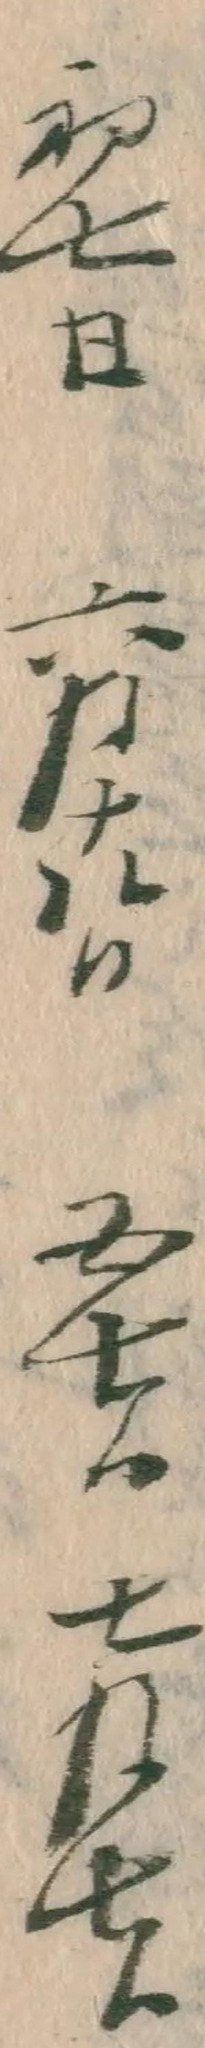初七日六月十八日五七日七月七日
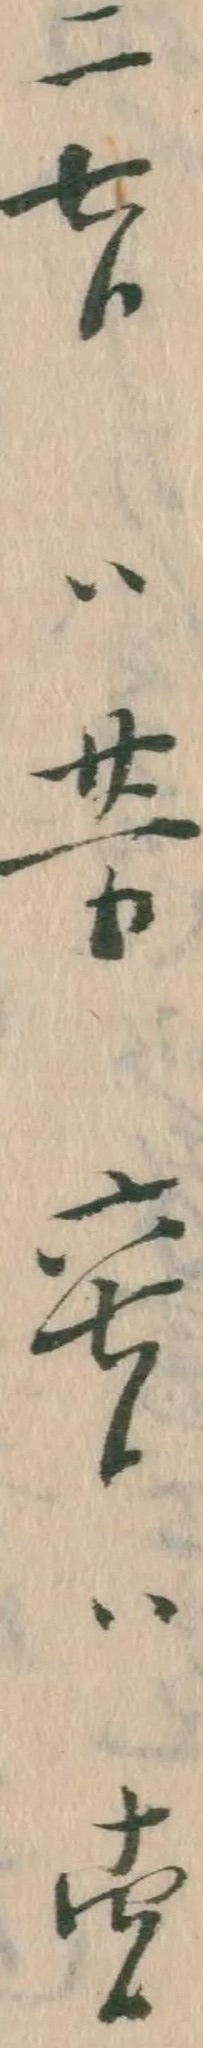二七日同廿一日六七日同十四日
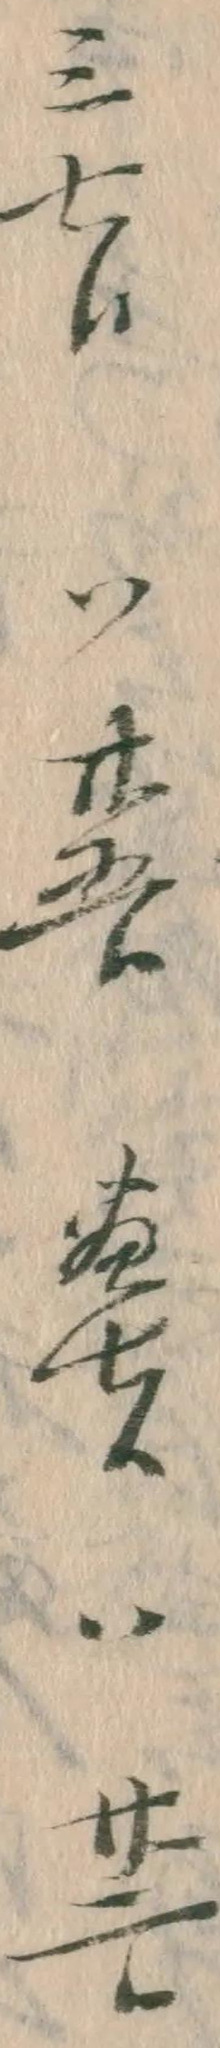三七日同廿五日七日同廿二日
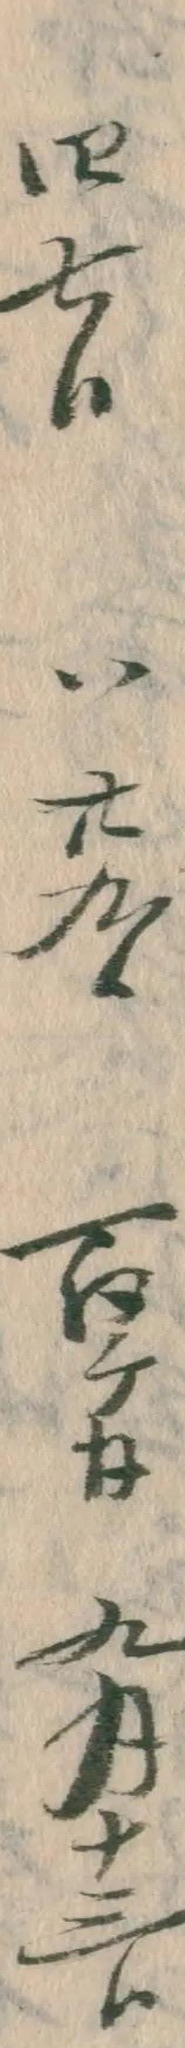四七日同廿九日百ケ日同九月十三日
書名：賀茂社記録. 第67冊
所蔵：国立国会図書館 National Diet Library, JAPAN
